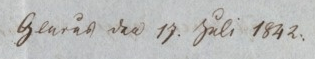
Glarus den 17. Juli 1842.
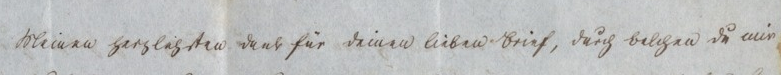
Meinen herzlichsten Dank für Deinen lieben Brief, durch welchen Du mir
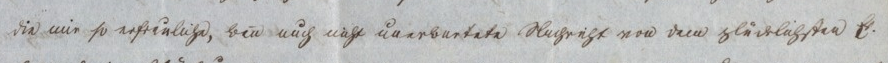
die mir so erfreuliche, wenn auch nicht unerwartete Nachricht von dem glücklichsten Er-
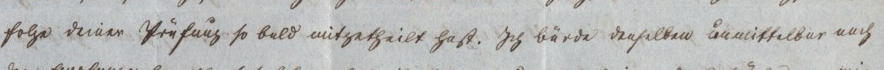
folge Deiner Prüfung so bald mitgetheilt hast. Ich würde denselben unmittelbar nach
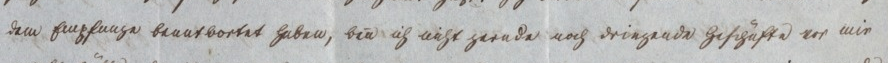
dem Empfange beantwortet haben, wenn ich nicht gerade noch dringende Geschäfte vor mir
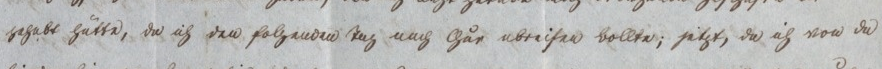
gehabt hätte, da ich den folgenden Tag nach Chur abreisen wollte; jetzt, da ich von da
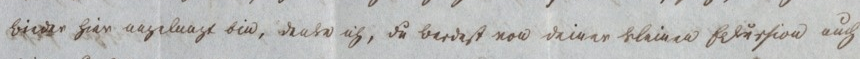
wieder hier angelangt bin, denke ich, Du werdest von Deiner kleinen Exkursion auch
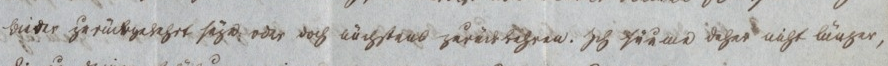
wieder zurückgekehrt seyn oder doch nächstens zurückkehren. Ich säume daher nicht länger,
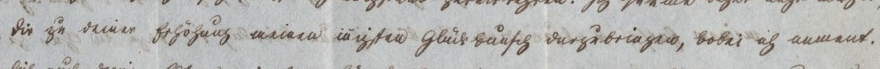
Dir zu Deiner Erhöhung meinen innigsten Glückwunsch darzubringen, wobei ich nament-
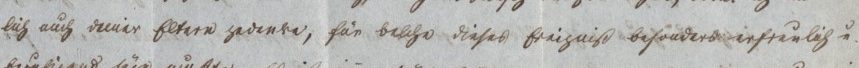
lich auch Deiner Eltern gedenke, für welche dieses Ereigniß besonders erfreulich u.
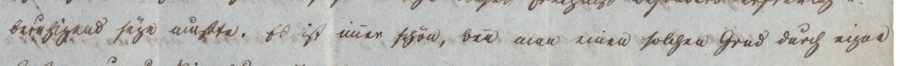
beruhigend seyn mußte. Es ist immer schön, wenn man einen solchen Grad durch eigne
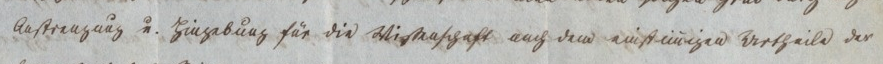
Anstrengung u. Hingebung für die Wissenschaft nach dem einstimmigen Urtheile der
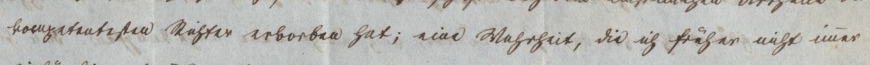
kompetentesten Richter erworben hat; eine Wahrheit, die ich früher nicht immer
